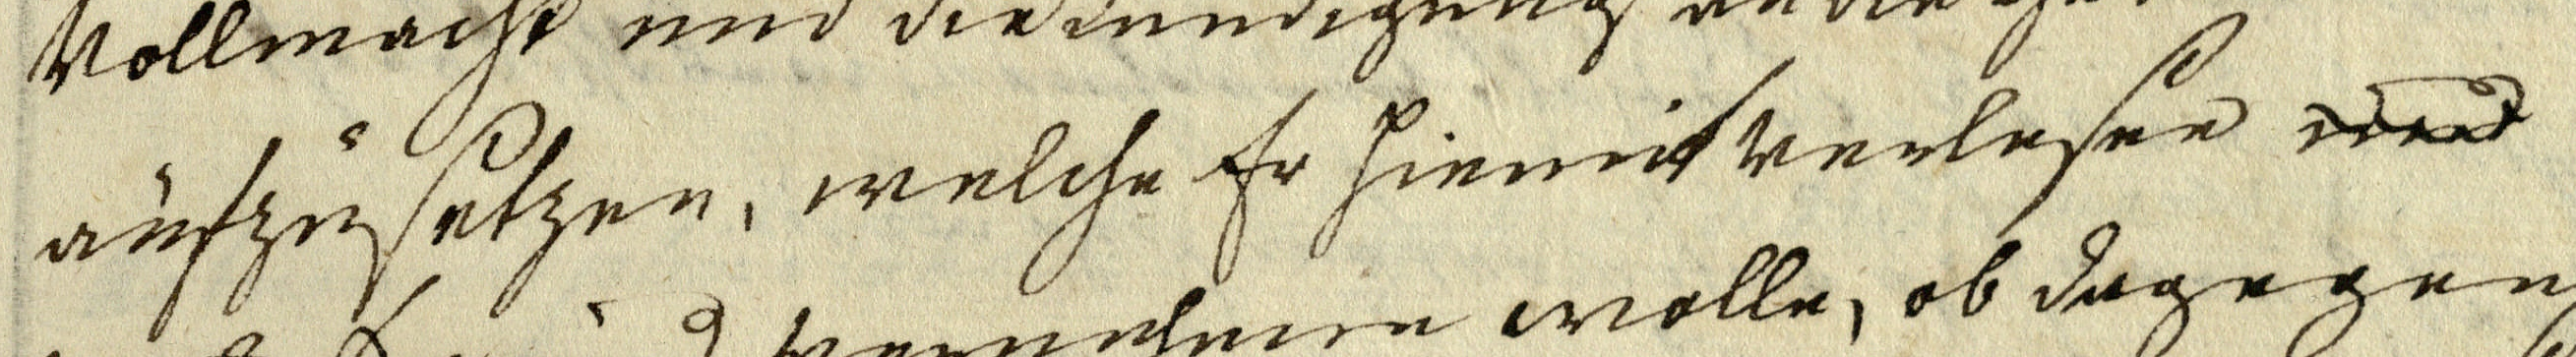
aufzusetzen, welche Er hiemit verlesen und
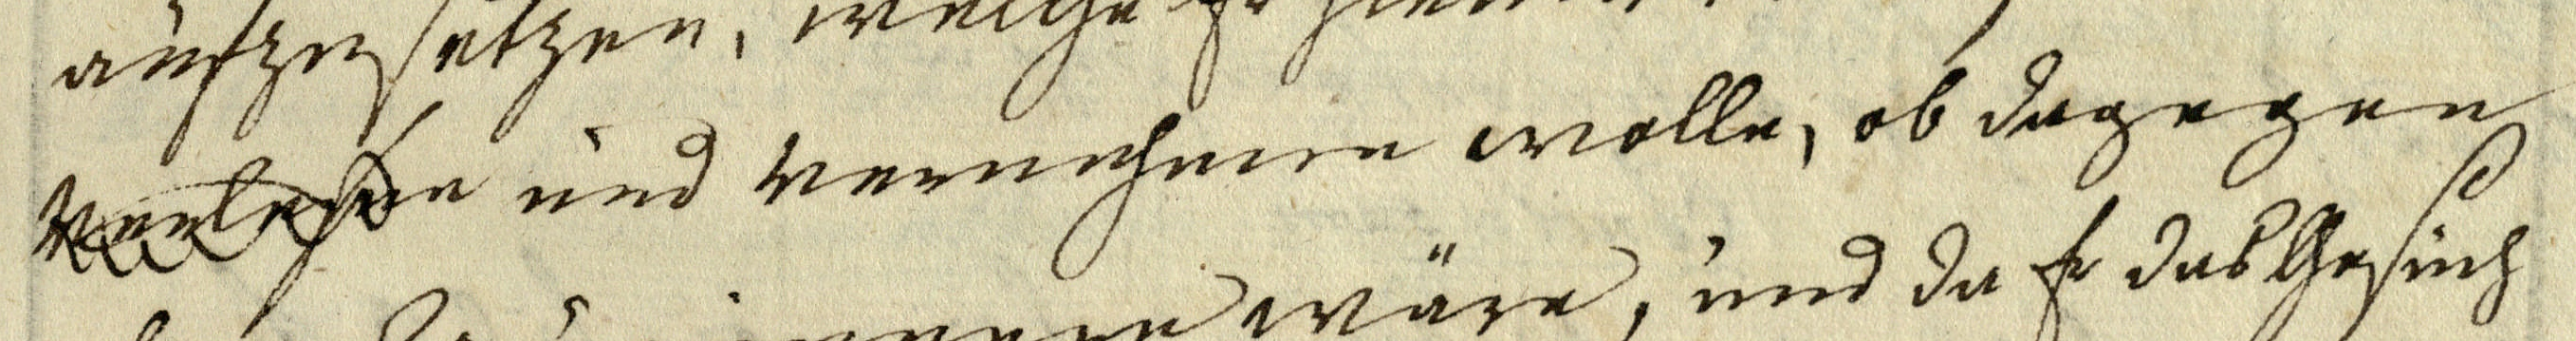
verlesen und vernehmen wolle, ob dagegen
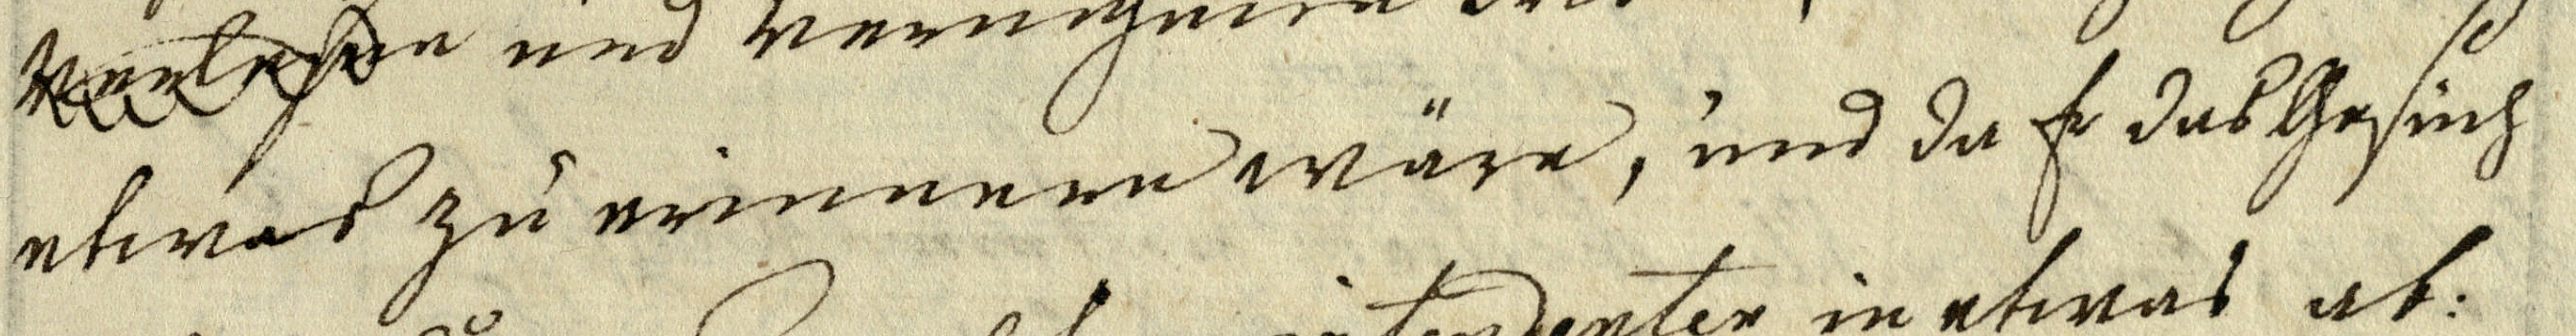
etwas zu erinnern wäre, und da Er das Gesuch
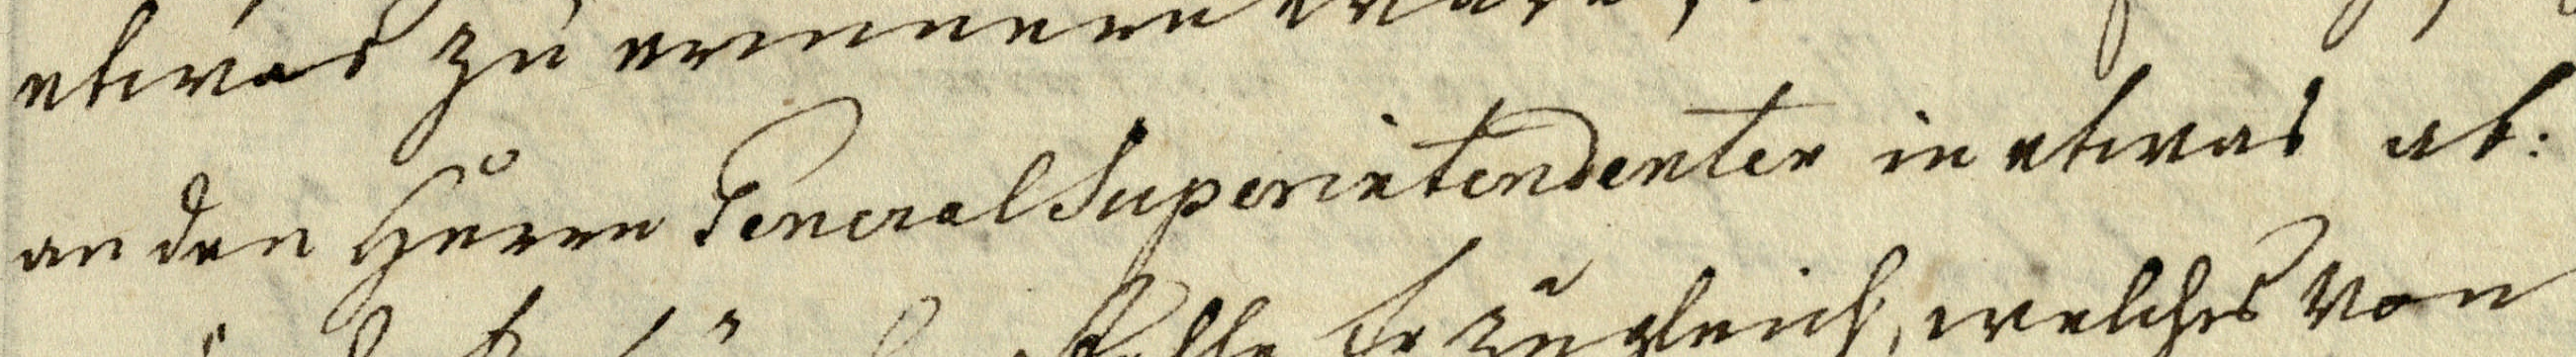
an den Herrn General Superintendenten in etwas ab¬
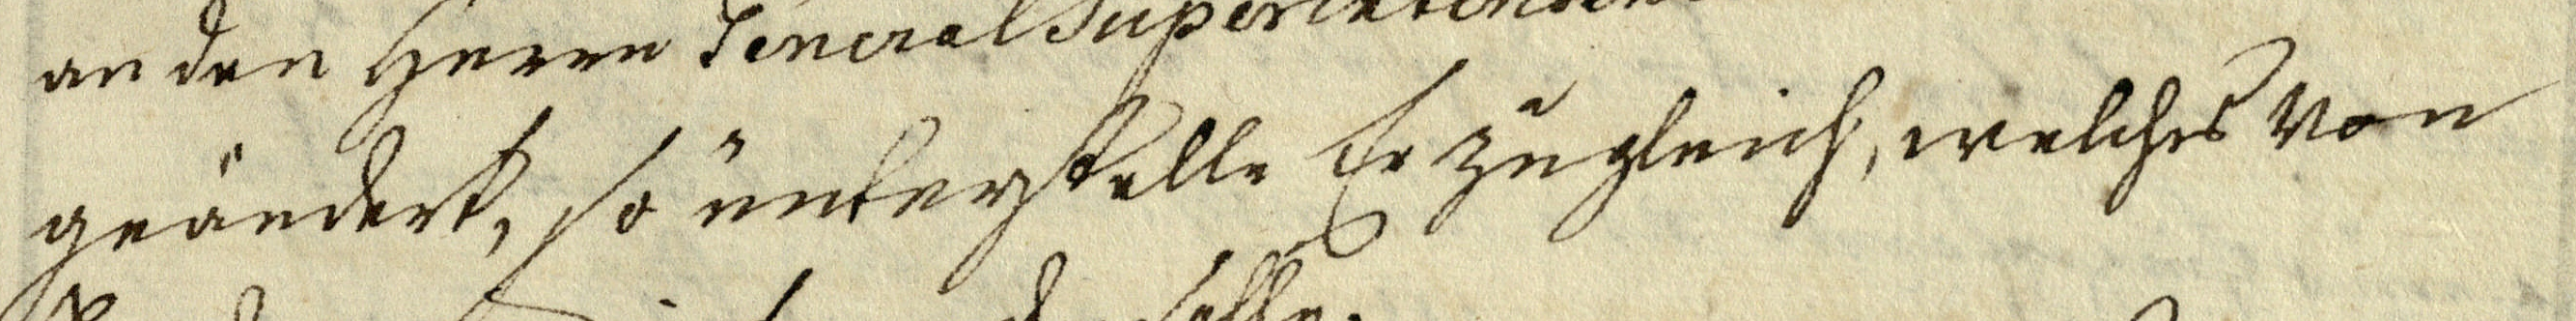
geändert, so unterstellte Er zugleich, welches von
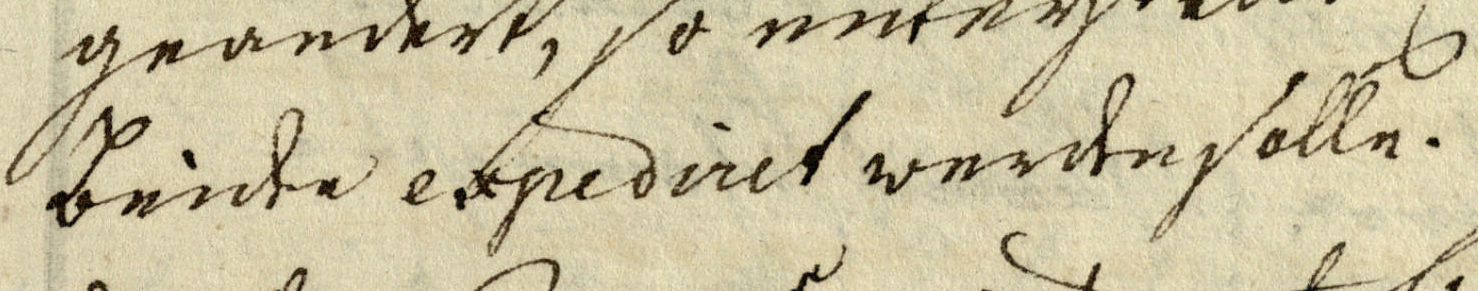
beide expediret werden solle.
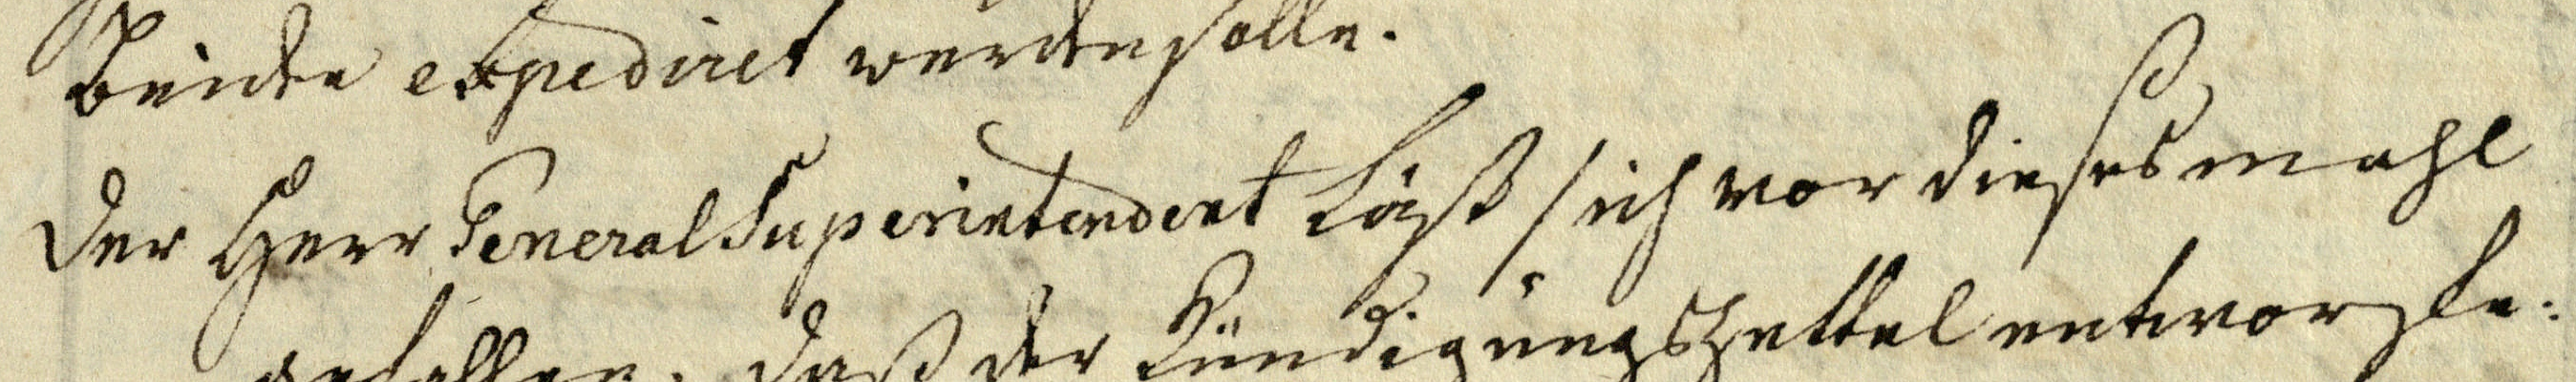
Der Herr General Superintendent Läßt sich vor dieses mahl
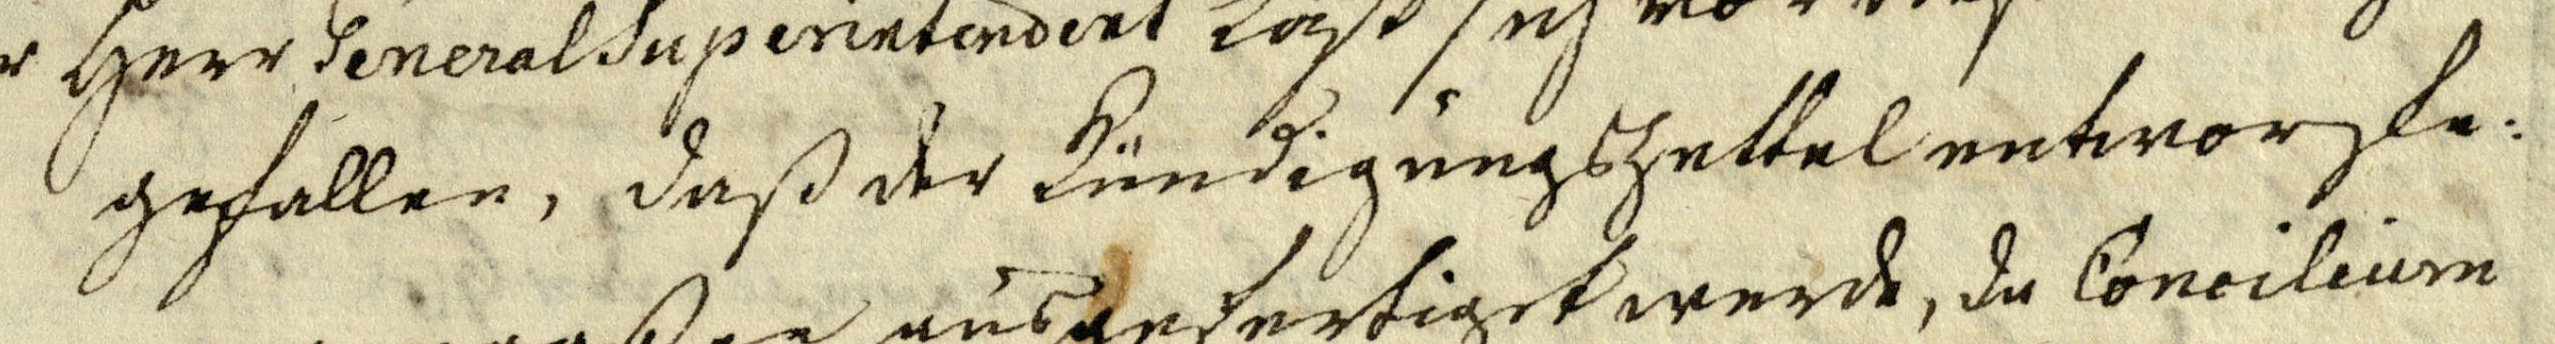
gefallen, daß der Kündigungszettel entworfen¬
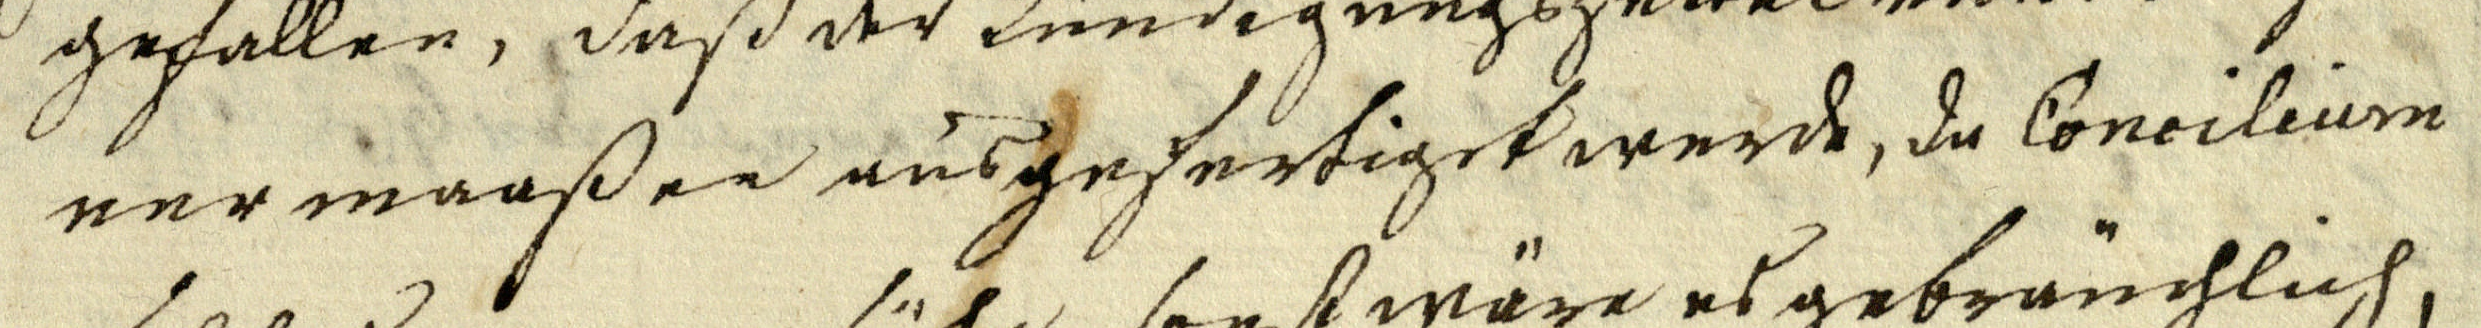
er maaßen ausgefertiget werde, da Concilium
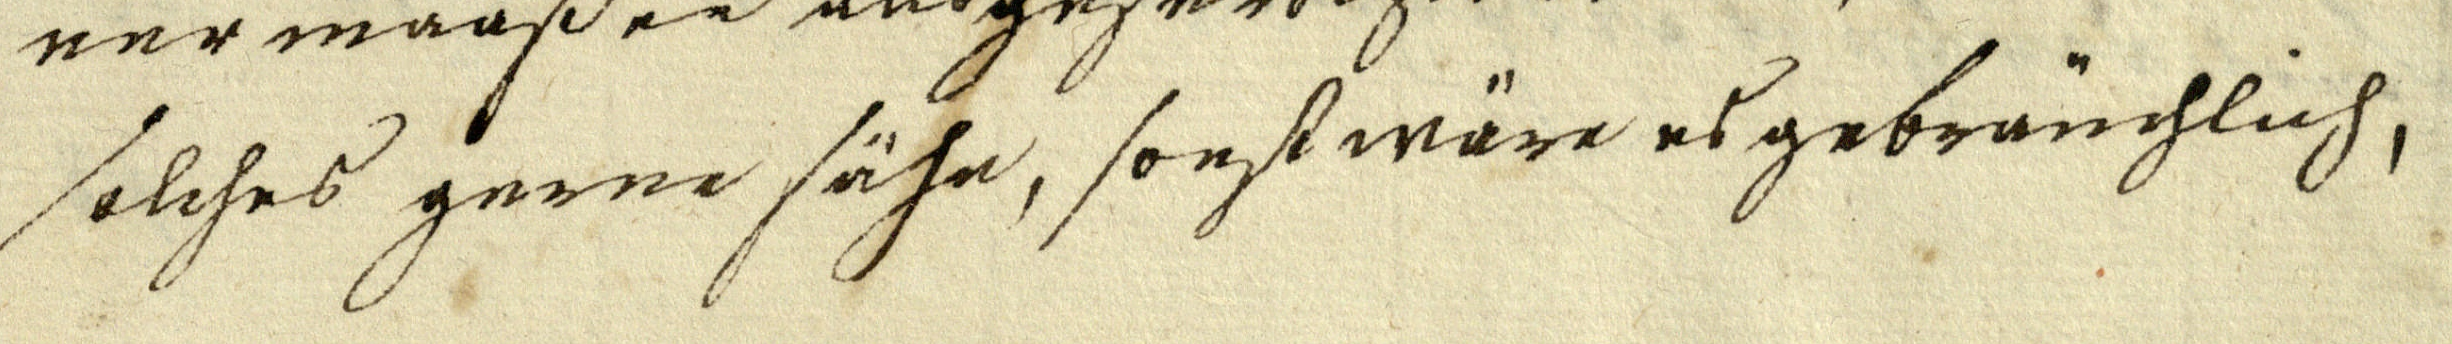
solches gerne sähe, sonst wäre es gebräuchlich,
